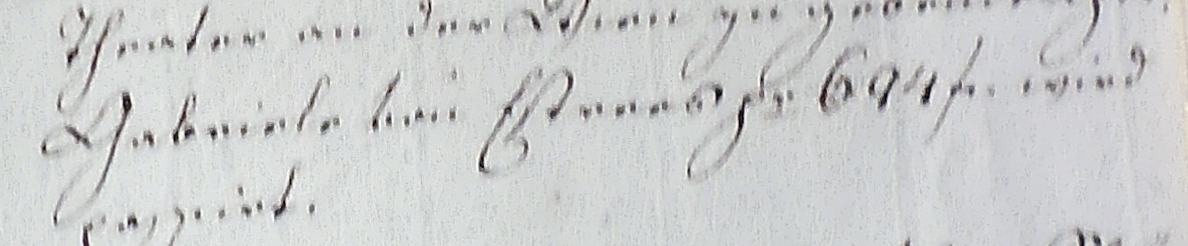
Gabriele von Estrees pr͇ 694fr. wird
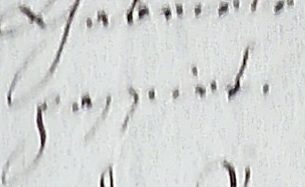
passirt.
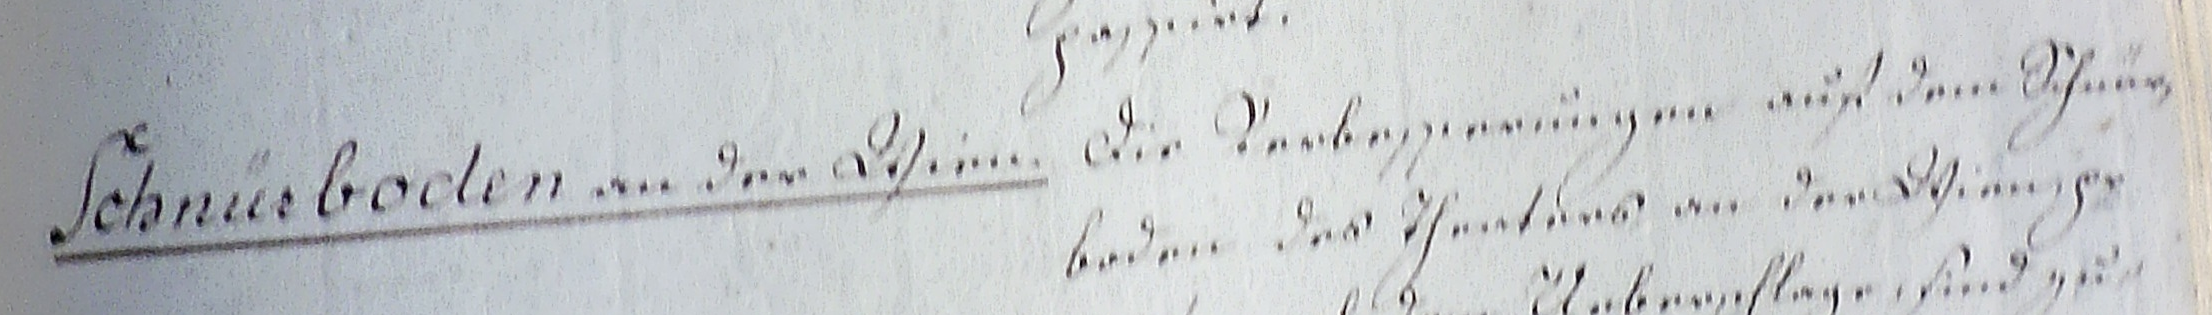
Schnürboden an der Wien. Die Verbesserungen auf dem Schnür¬
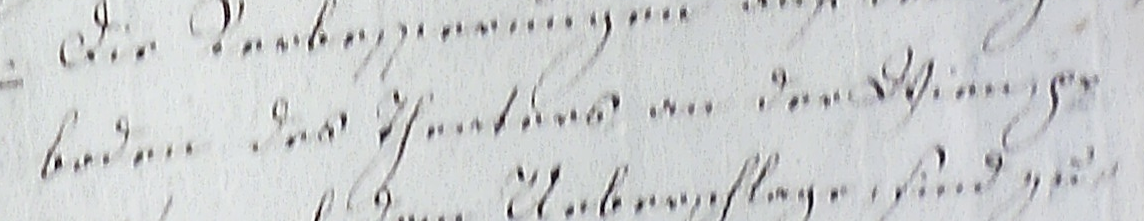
boden des Theaters an der Wien pr͇
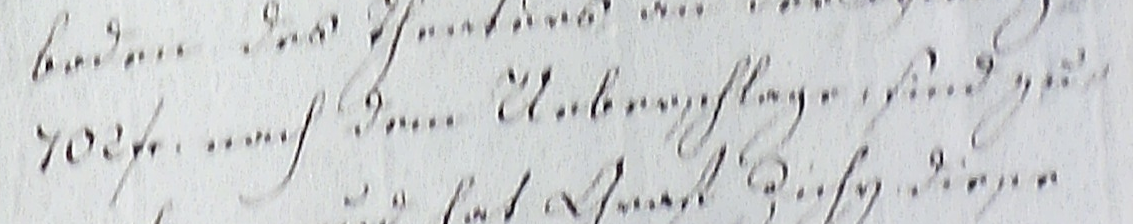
702fr. nach dem Ueberschlage, sind zu¬
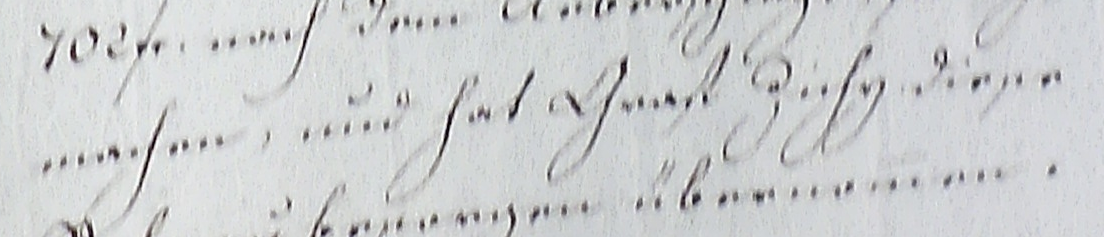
machen, und hat Graf Zichy diese
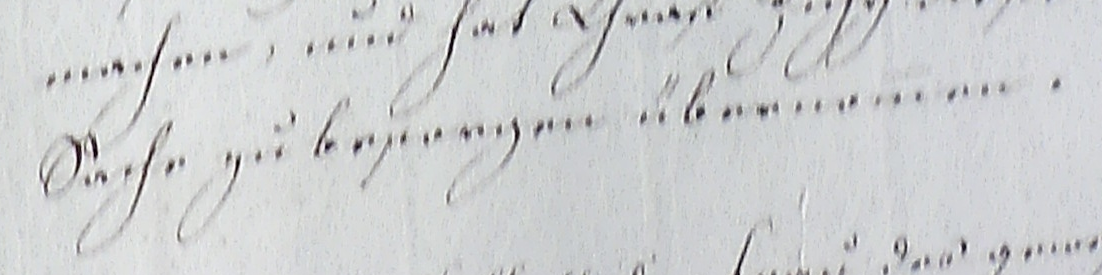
Sache zu besorgen übernom̅en.
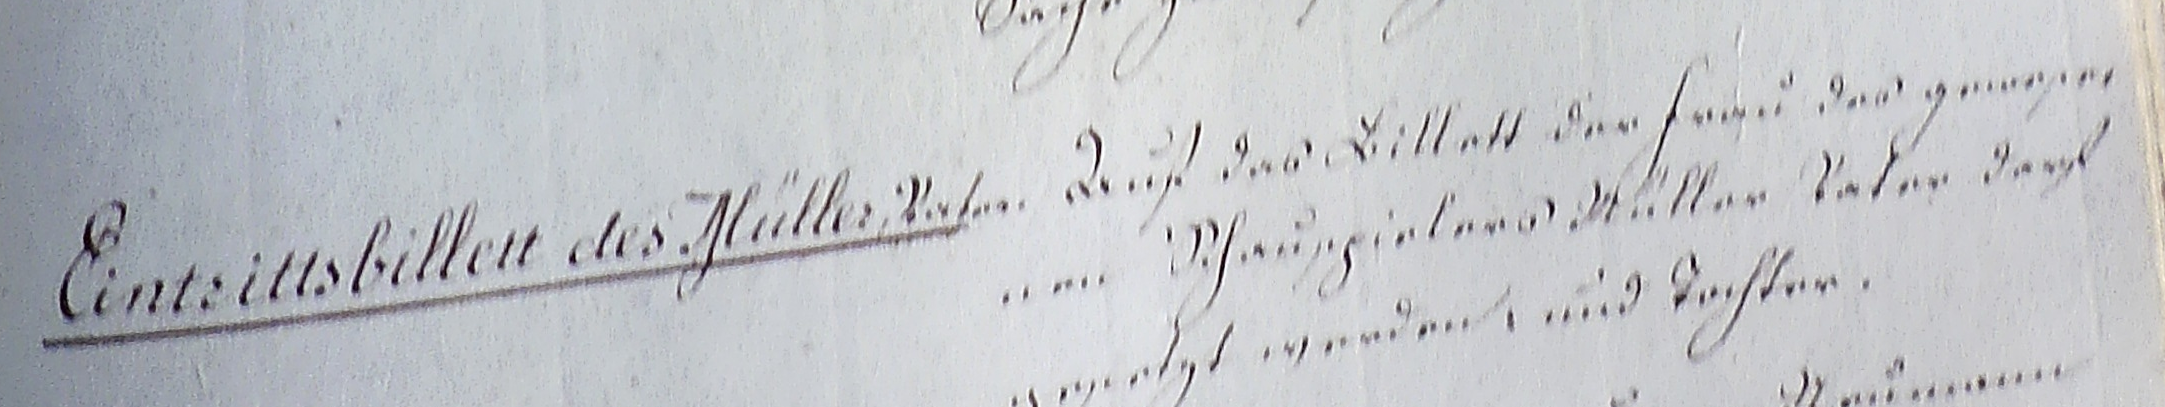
Eintrittsbillett des Müller, Vater. Auf das Billett der Frau des gewese¬
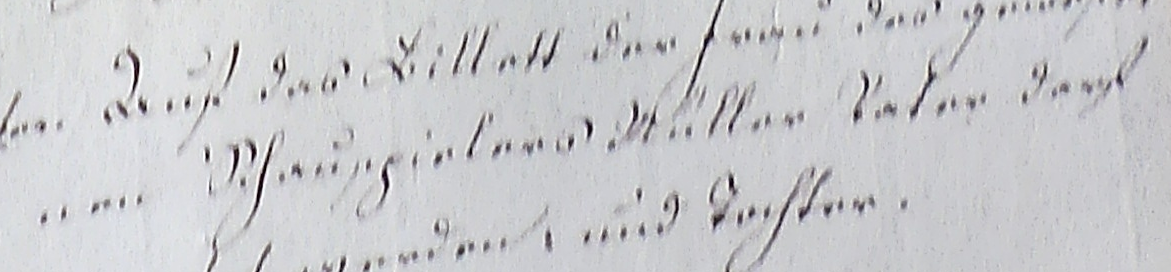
nen Schauspielers Müller Vater darf
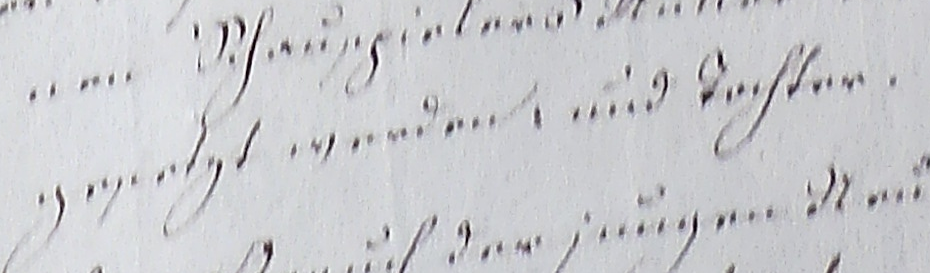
gesetzt werden, und Tochter.
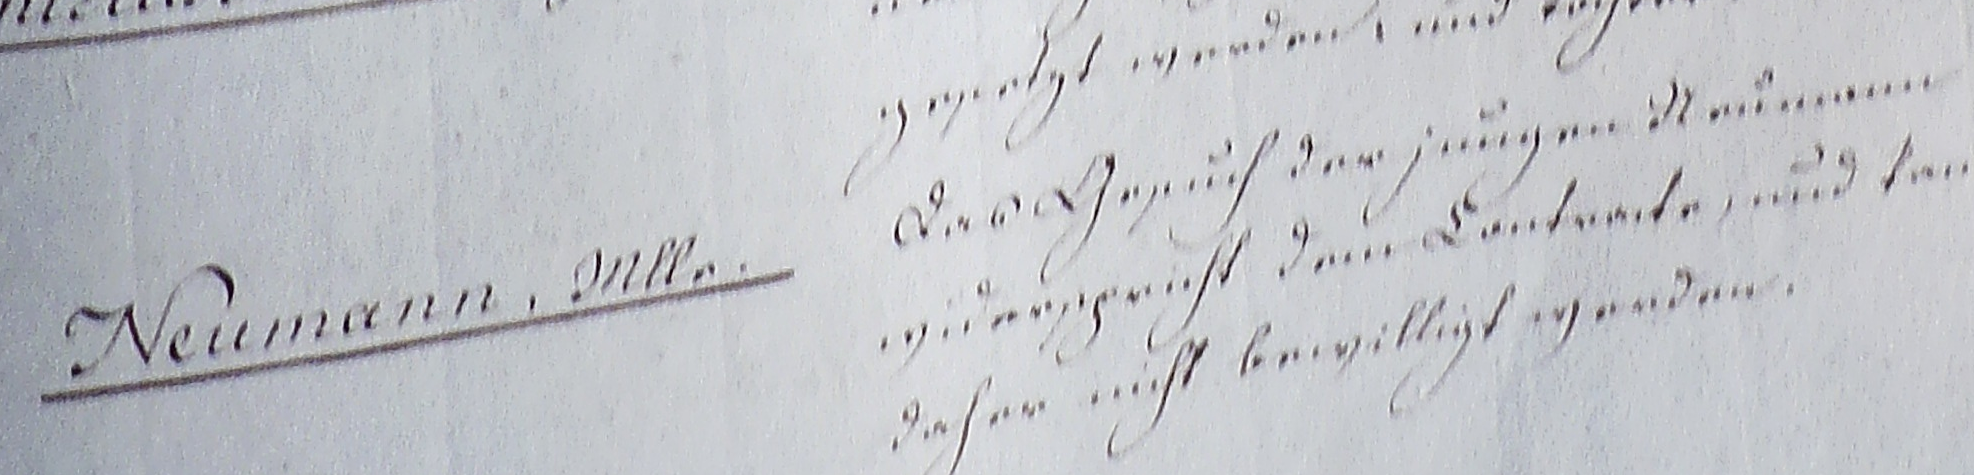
Neumann, Mlle. Das Gesuch der jungen Neumann
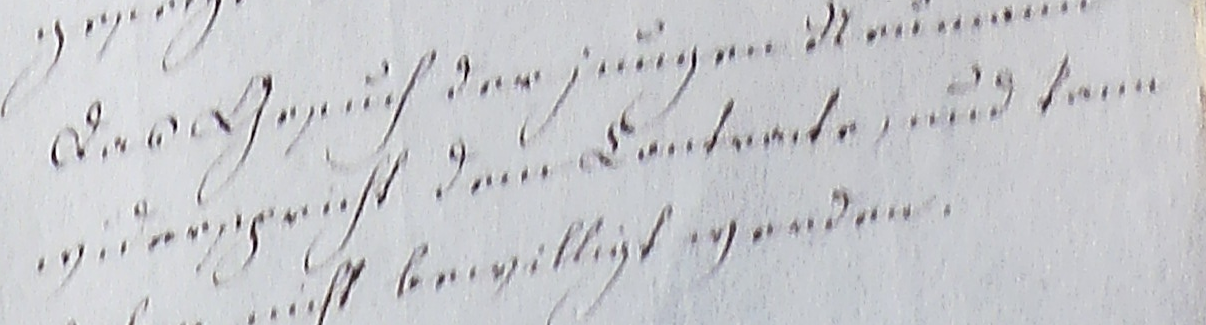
widerspricht dem Contracte, und kann
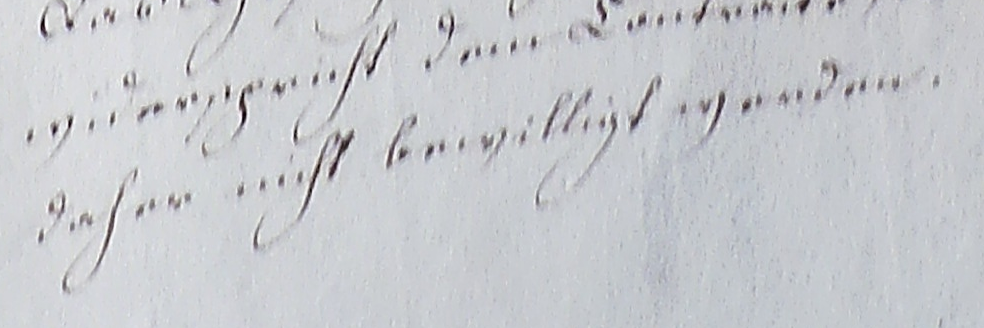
daher nicht bewilligt werden.
